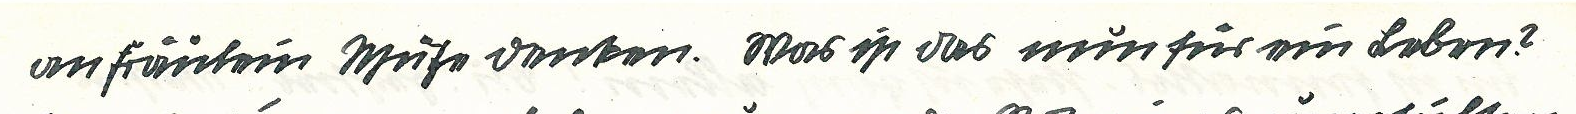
an Fräulein S. denken. Was ist das nun für ein Leben?
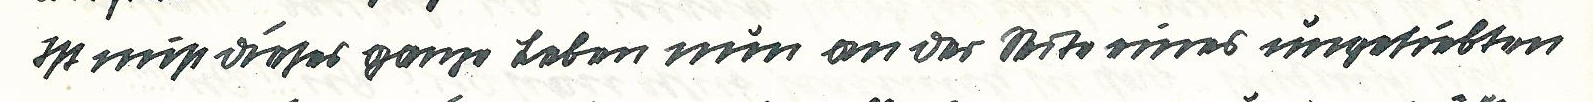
Ist nicht dieses ganze Leben nun an der Seite eines ungeliebten
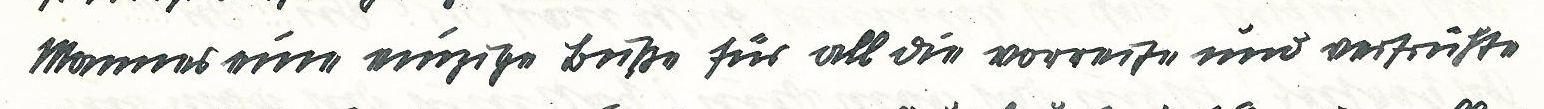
Mannes eine einzige Buße für all die vorreife und verfrühte
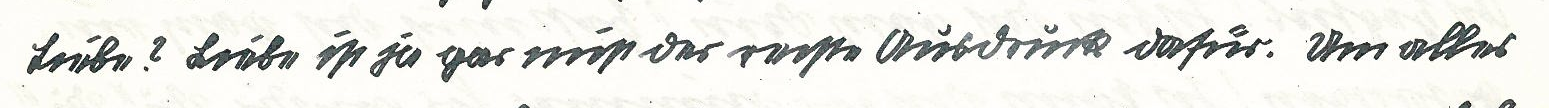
Liebe? Liebe ist ja gar nicht der rechte Ausdruck dafür. Um alles
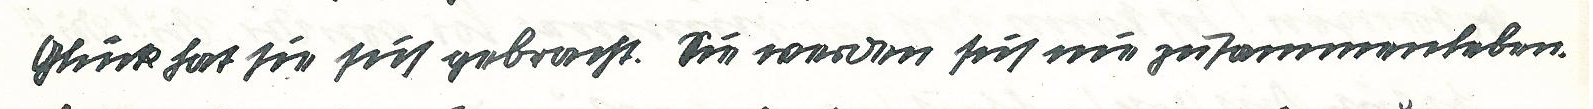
Glück hat sie sich gebracht. Sie werden sich nie zusammenleben.
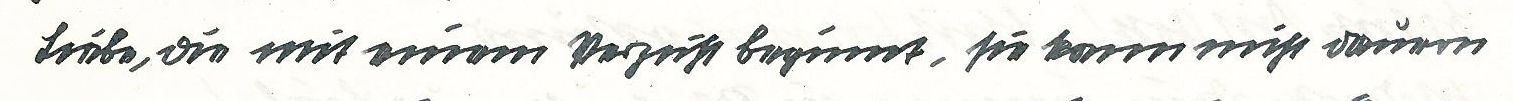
Liebe, die mit einem Verzicht beginnt, sie kann nicht dauern
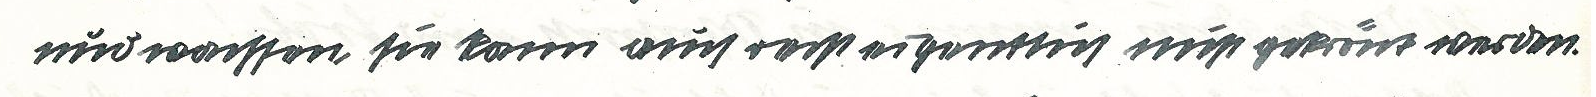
und wachsen, sie kann auch erst eigentlich nicht gekrönt werden.
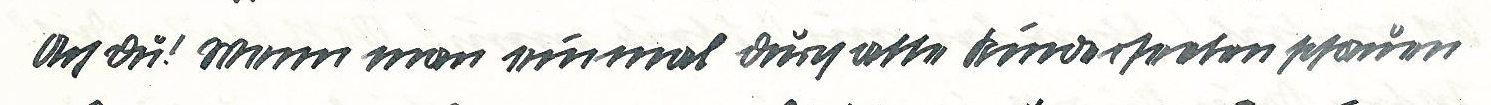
Ach Du! Wenn man einmal durch alle Kinderseelen schauen
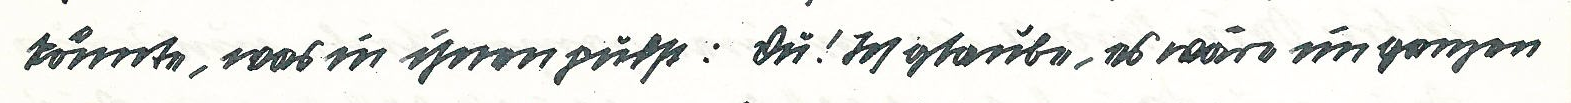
könnte, was in ihnen pulst: Du! Ich glaube, es wäre im ganzen
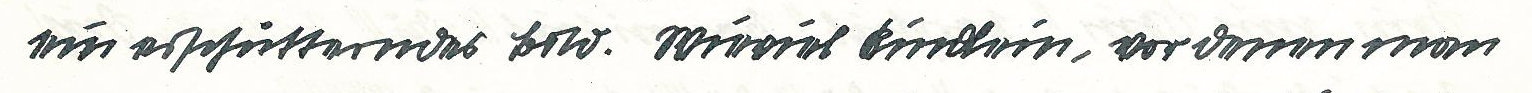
ein erschütterndes Bild. Wieviel Kindlein, vor denen man
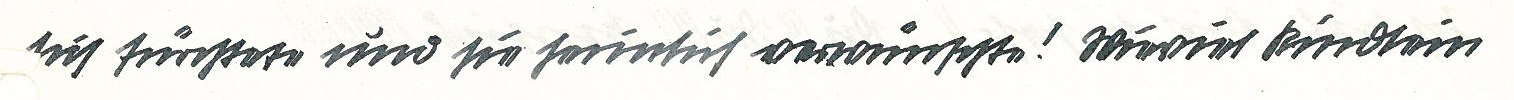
sich fürchtete und sie herrisch verwünschte! Wieviel Kindlein
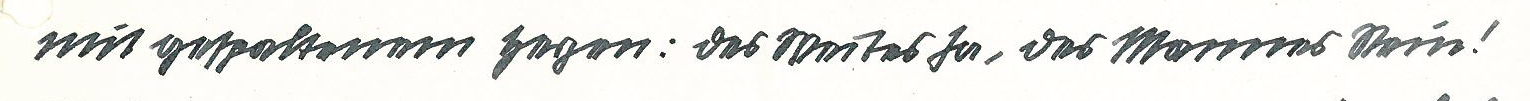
mit gespaltenem Herzen: Des Weibes Ja, des Mannes Nein!
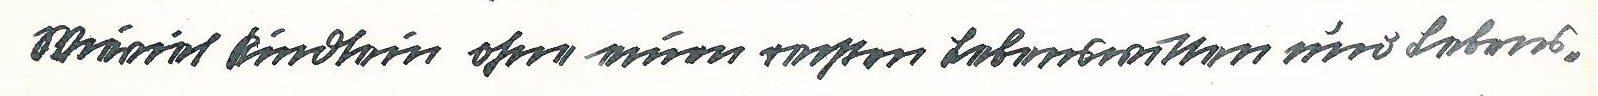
Wieviel Kindlein ohne einen rechten Lebenswillen und Leben¬
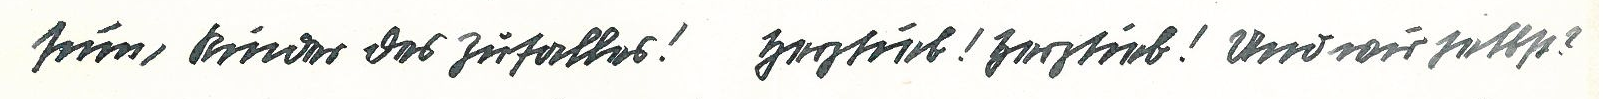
ssinn, Kinder des Zufalles! Herzlieb! Herzlieb! Und wir selbst?
